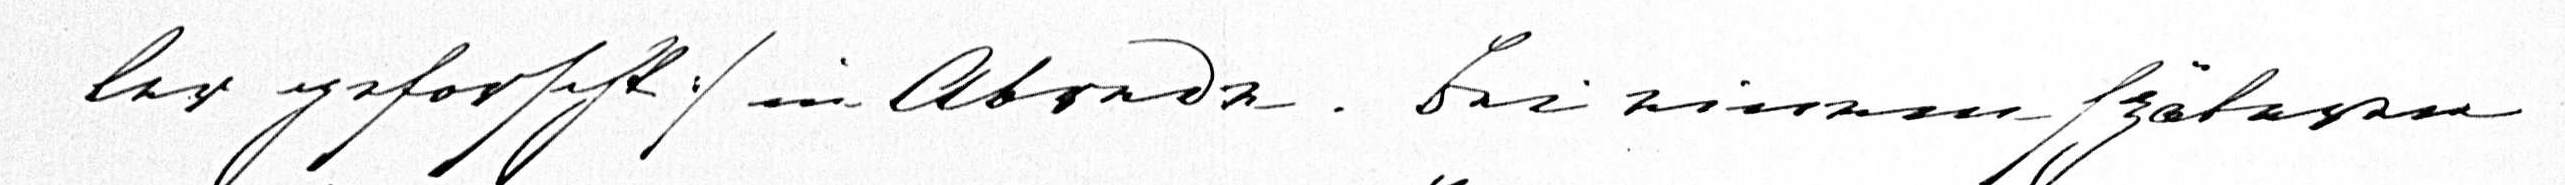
ler geforscht) in Abrede. Bei einem späteren
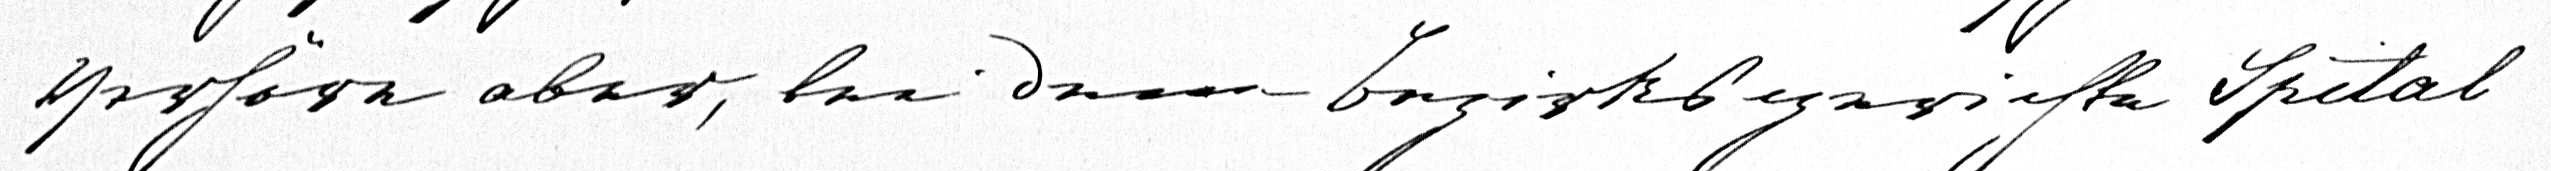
Verhöre aber, bei dem Bezirksgerichte Spital
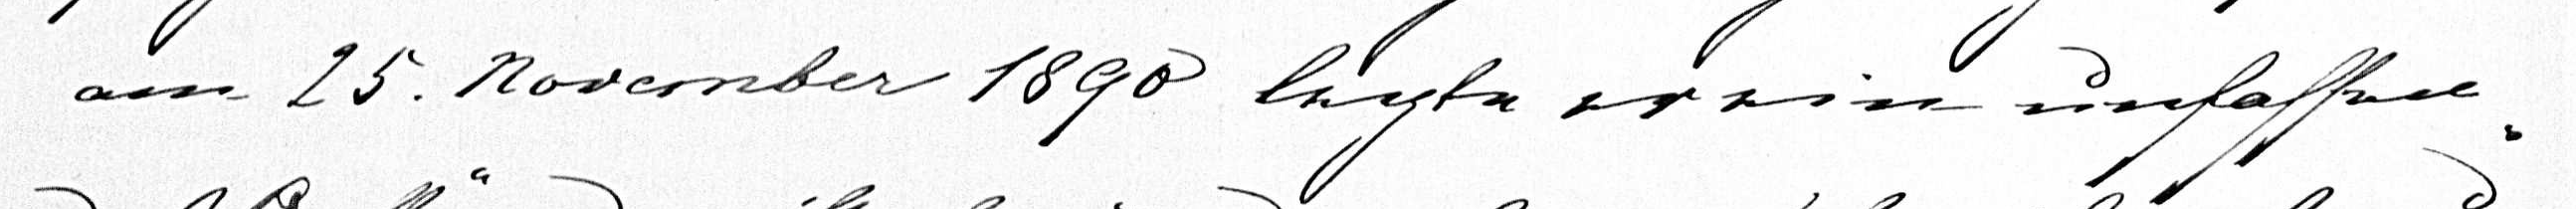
am 25. November 1890 legte er ein umfassen¬
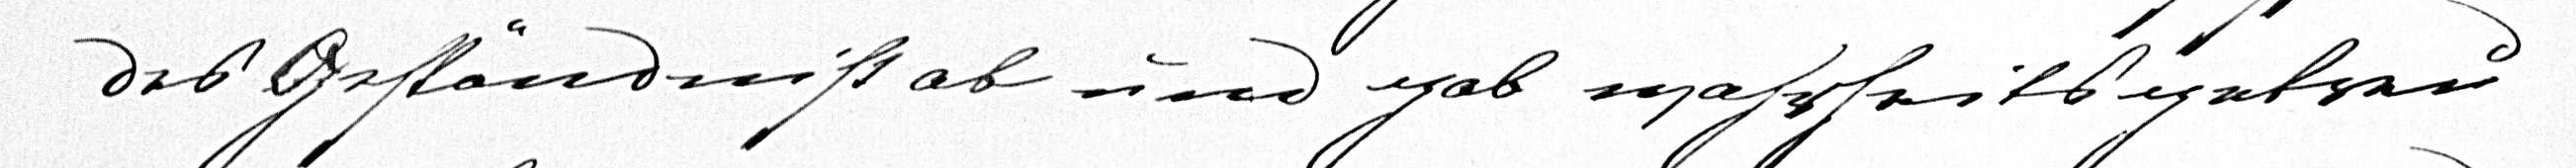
des Geständnis ab und gab wahrheitsgetreu
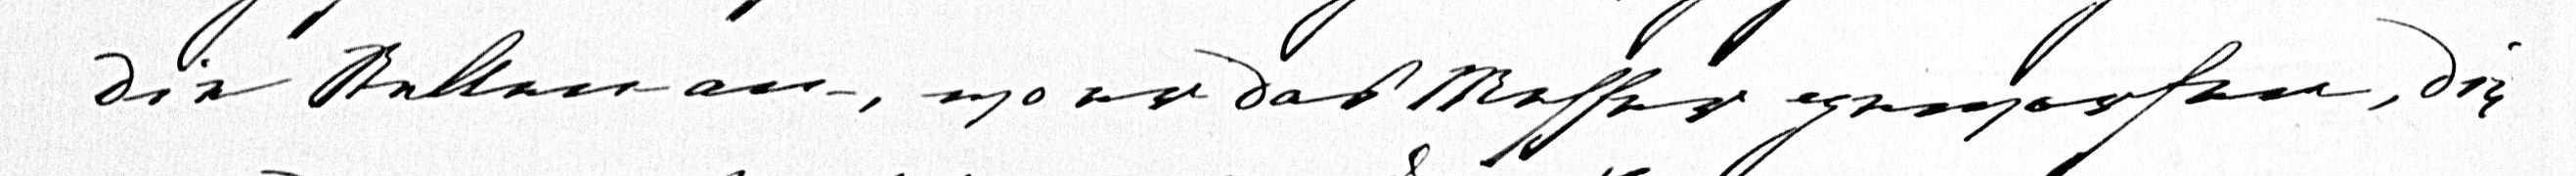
die Stellen an, wo er das Messer geworfen, die
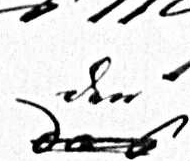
den
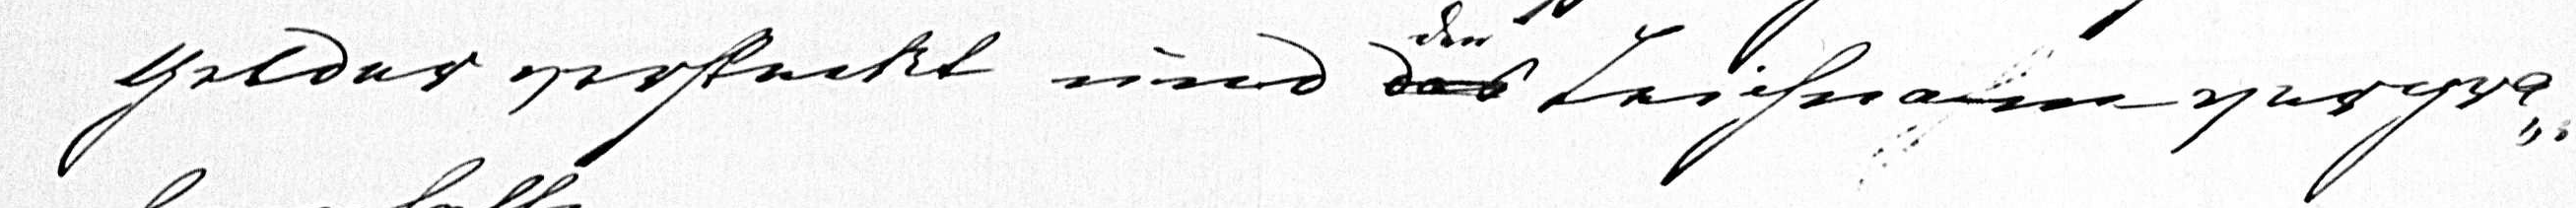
Gelder versteckt und Leichnam vergra¬
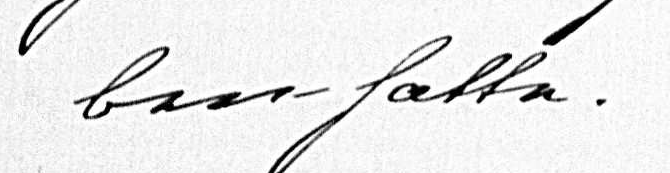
ben hatte.
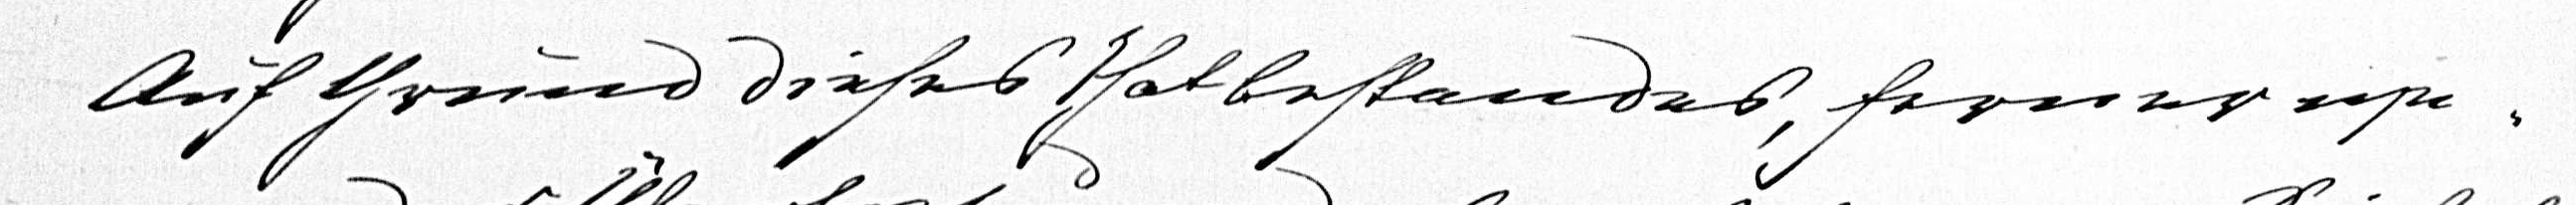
Auf Grund dieses Thatbestandes, ferner we¬
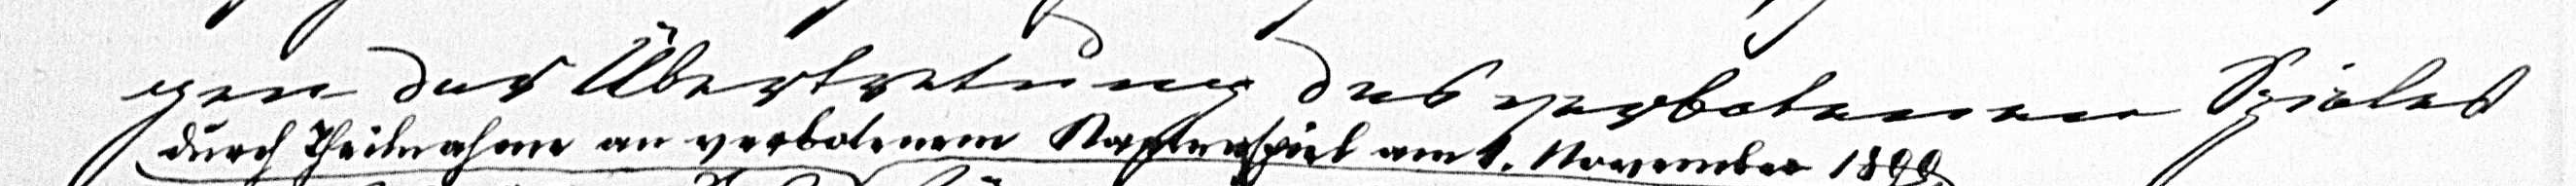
gen des Übertretung des verbotenen Spieles
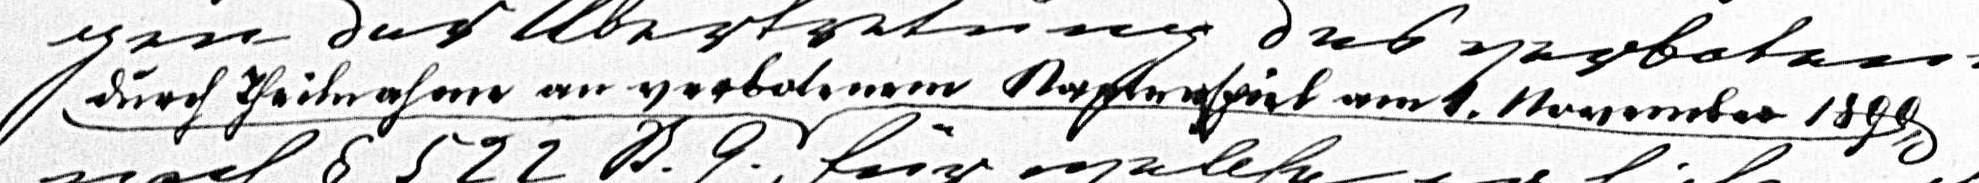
durch Theilnahme an verbotenem Staarspiel? Am 1. November 1899,
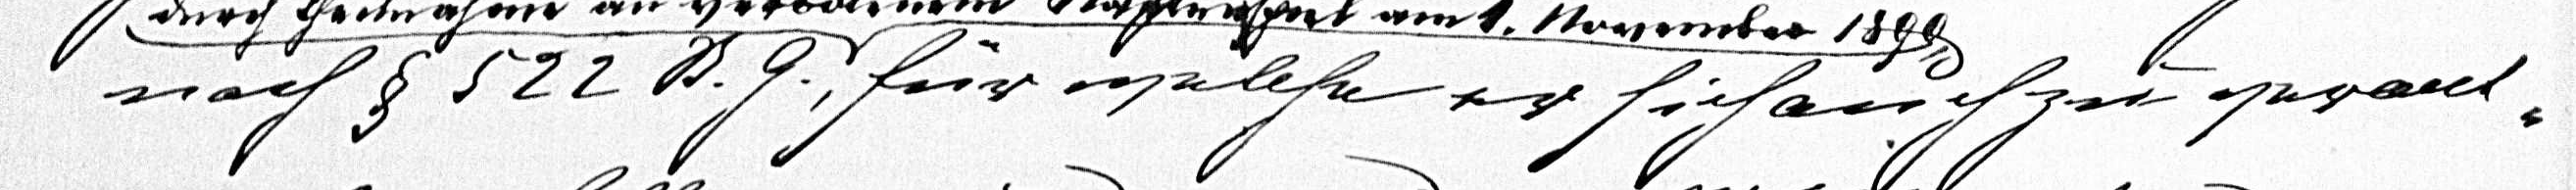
nach §522 St G. für welche er sich auch zu verant¬
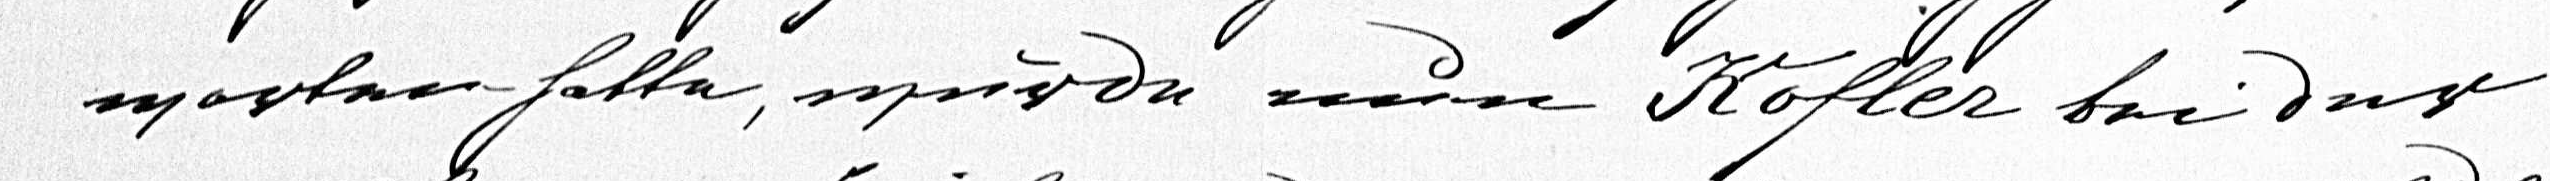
worten hatte, wurde nun Kofler bei der
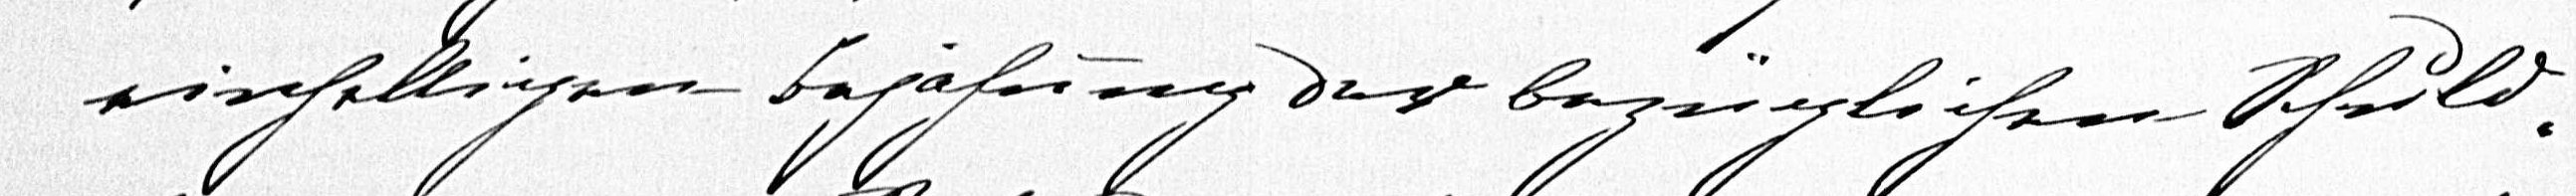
einhelligen Bejahung der bezüglichen Schuld¬
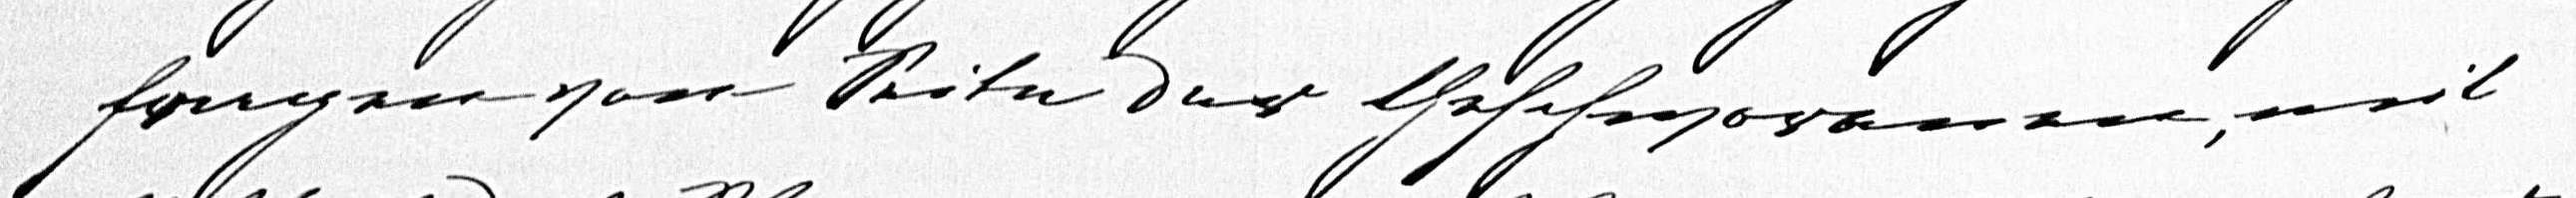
fragen von Seite der Geschworenen, mit
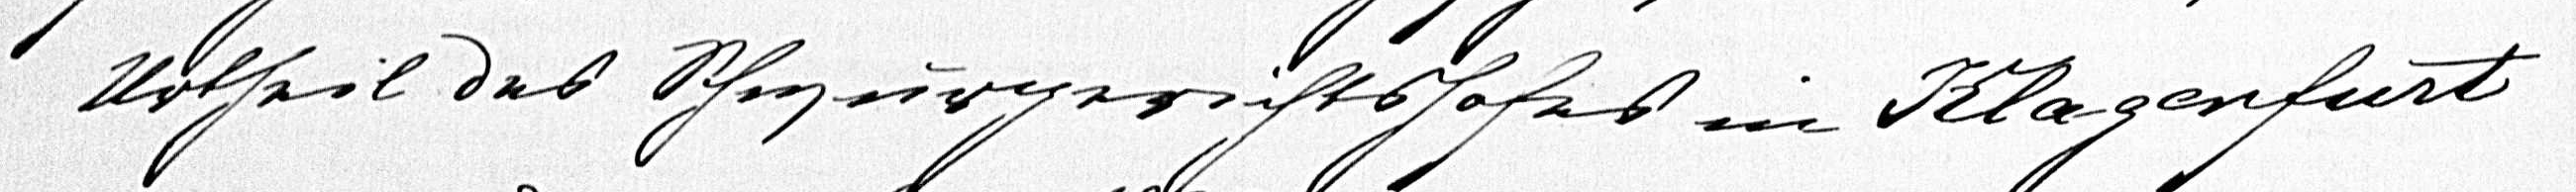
Urtheil des Schwurgerichtshofes in Klagenfurt
